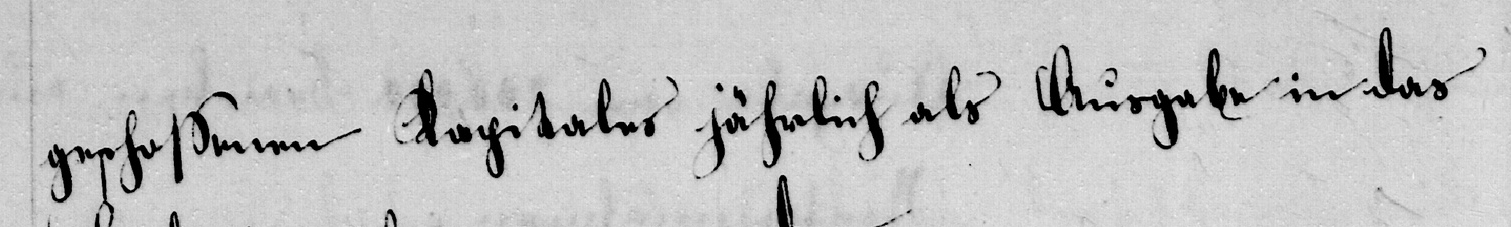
geschoßenen Kapitales jährlich als Ausgabe in das
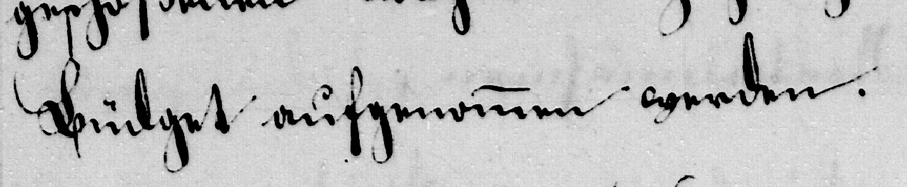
Büdget aufgenommen werden.
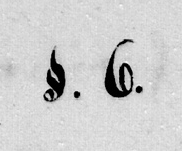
§. 6.
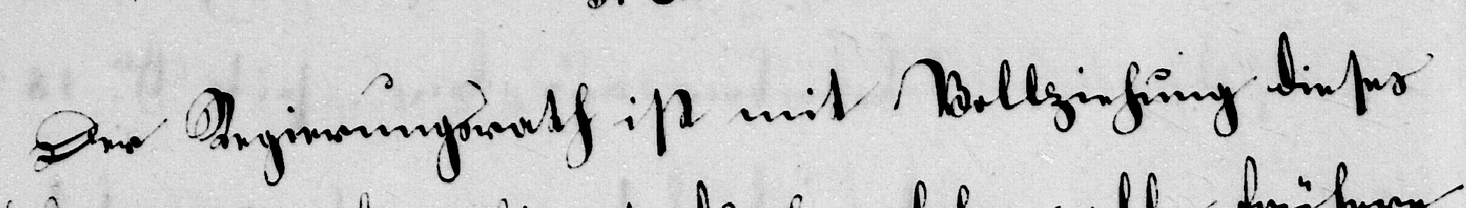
Der Regierungsrath ist mit Vollziehung dieses
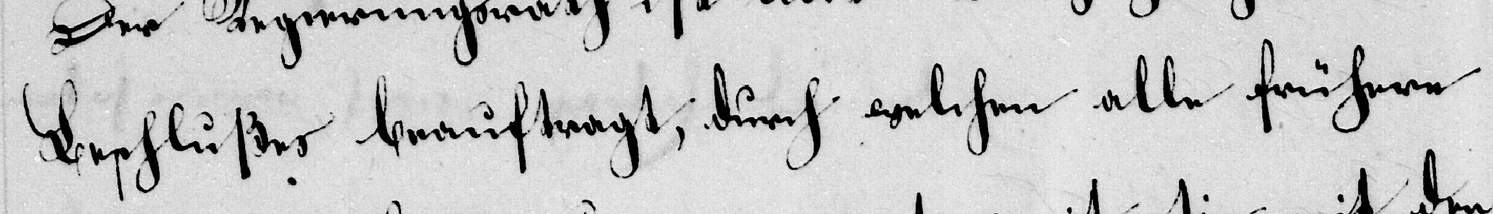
Beschlußes beauftragt, durch welchen alle frühern
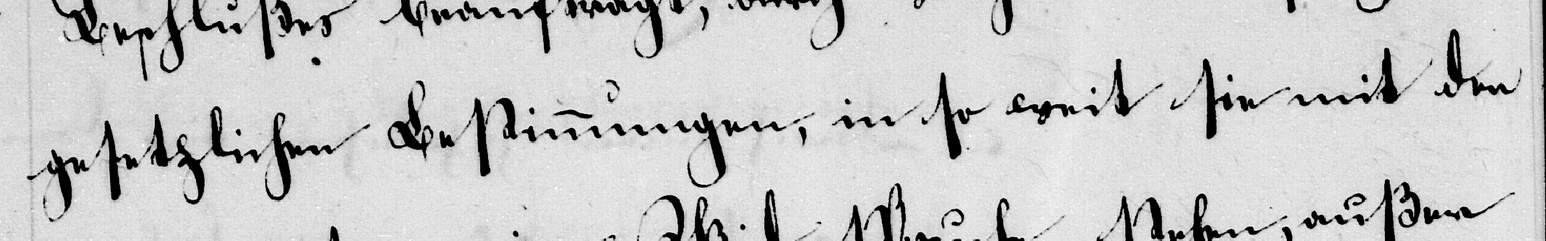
gesetzlichen Bestimmungen, in so weit sie mit den
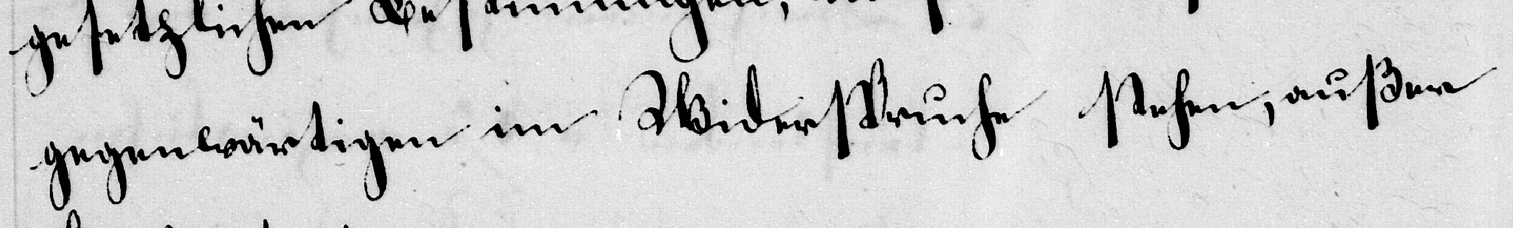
gegenwärtigen im Widerspruche stehen, außer
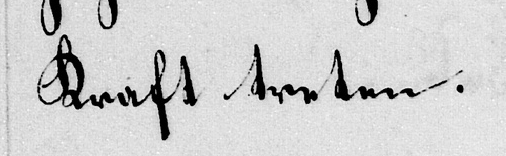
Kraft treten.
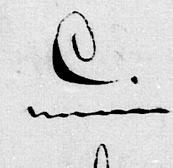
C.
